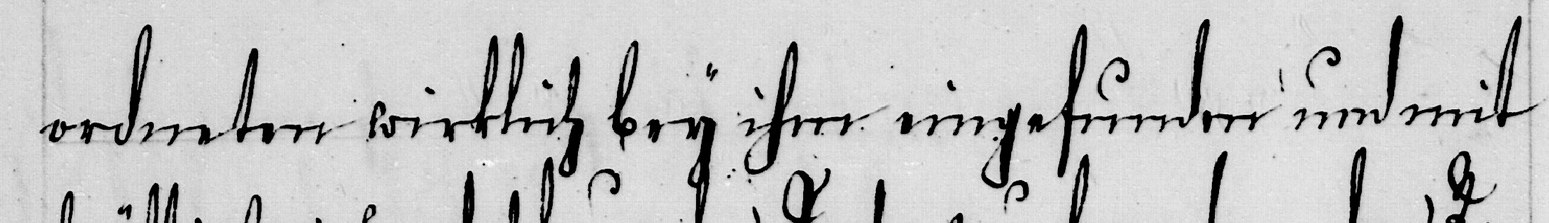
ordneten wirklich bey ihm eingefunden und mit
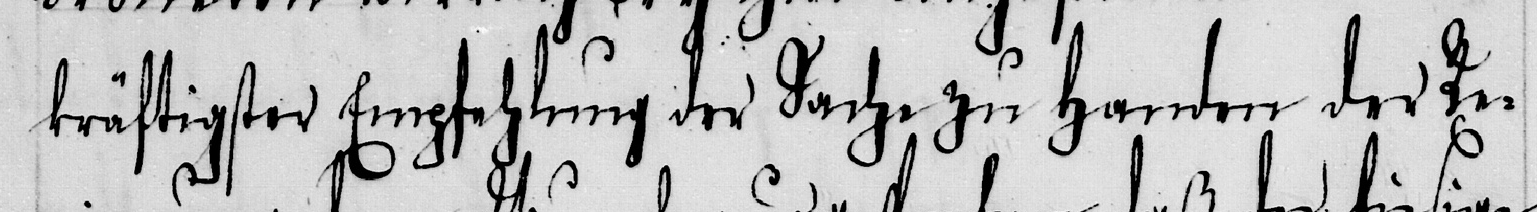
kräftigster Empfehlung der Sache zu Handen der Re¬
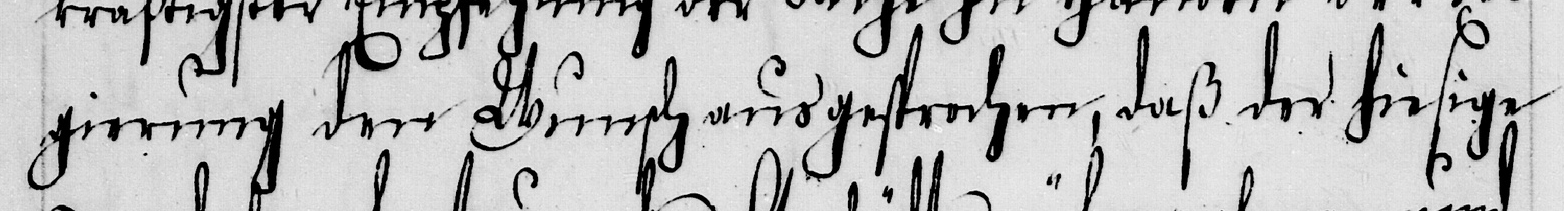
gierung den Wunsch ausgesprochen, daß der hiesige
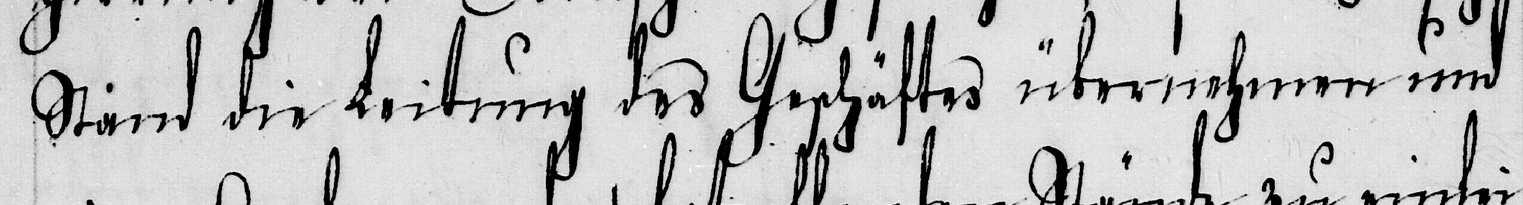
Stand die Leitung des Geschäftes übernehmen und
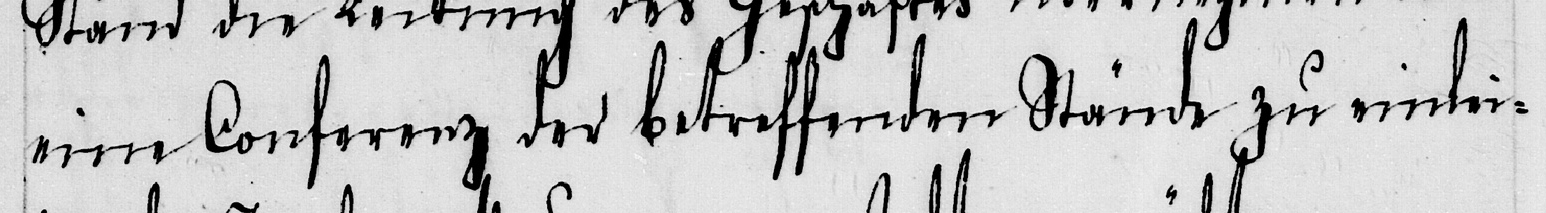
eine Conferenz der betreffenden Stände zu einlei¬
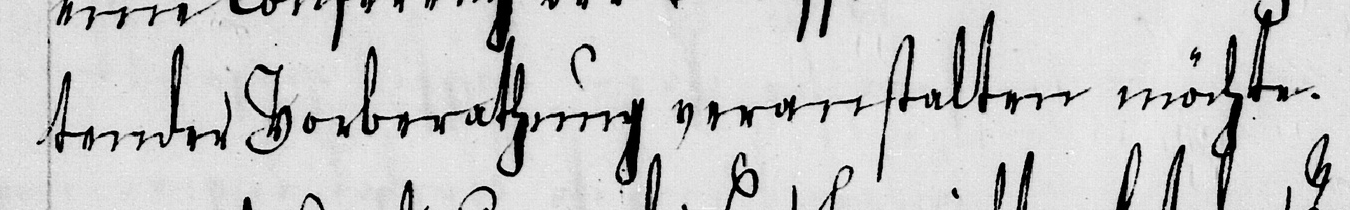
tender Vorberathung veranstalten möchte.
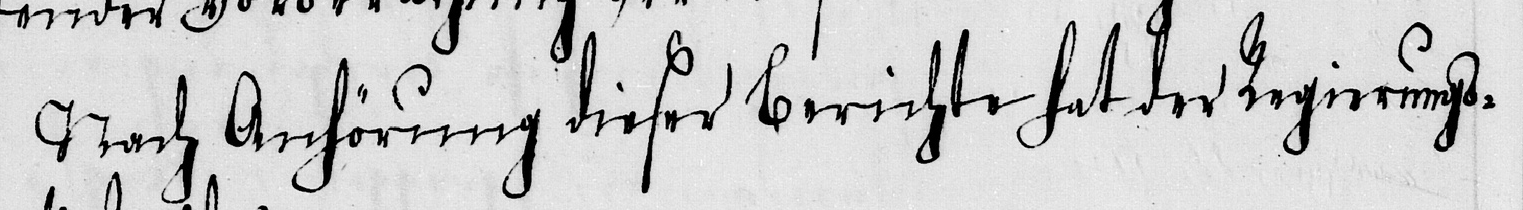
Nach Anhörung dieser Berichte hat der Regierungs¬
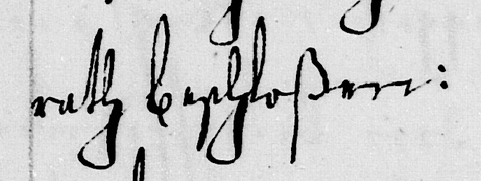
rath beschloßen:
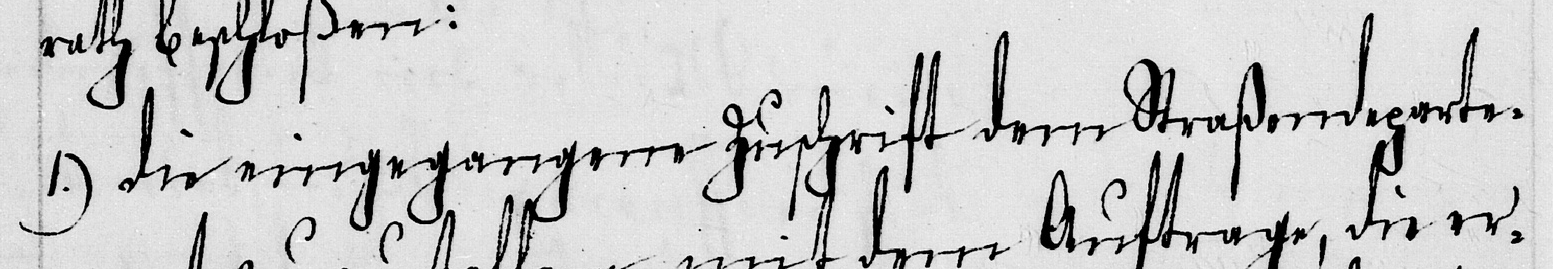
1.) die eingegangene Zuschrift dem Straßendeparte¬
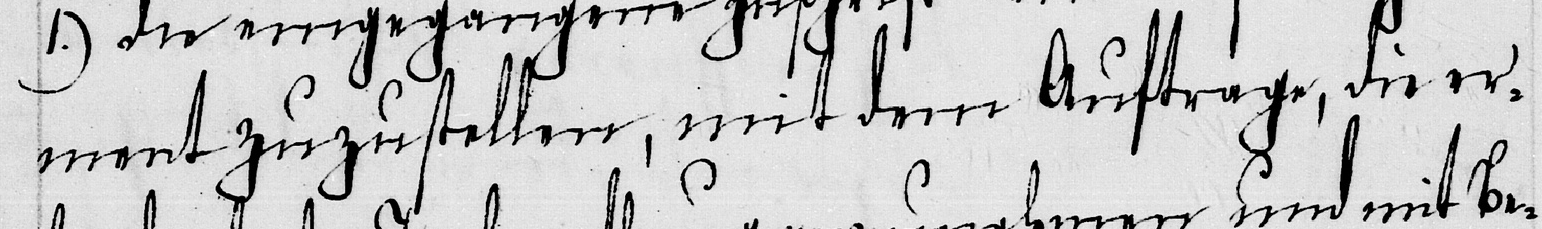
ment zuzustellen, mit dem Auftrage, die er¬
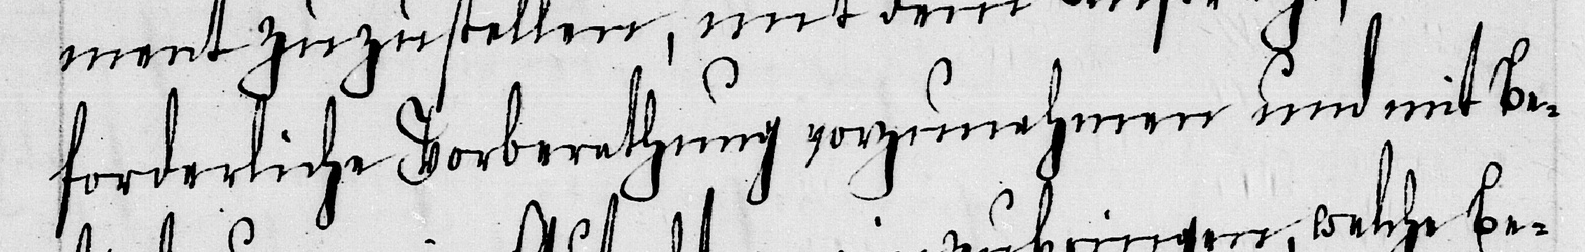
forderliche Vorberathung vorzunehmen und mit Be¬
